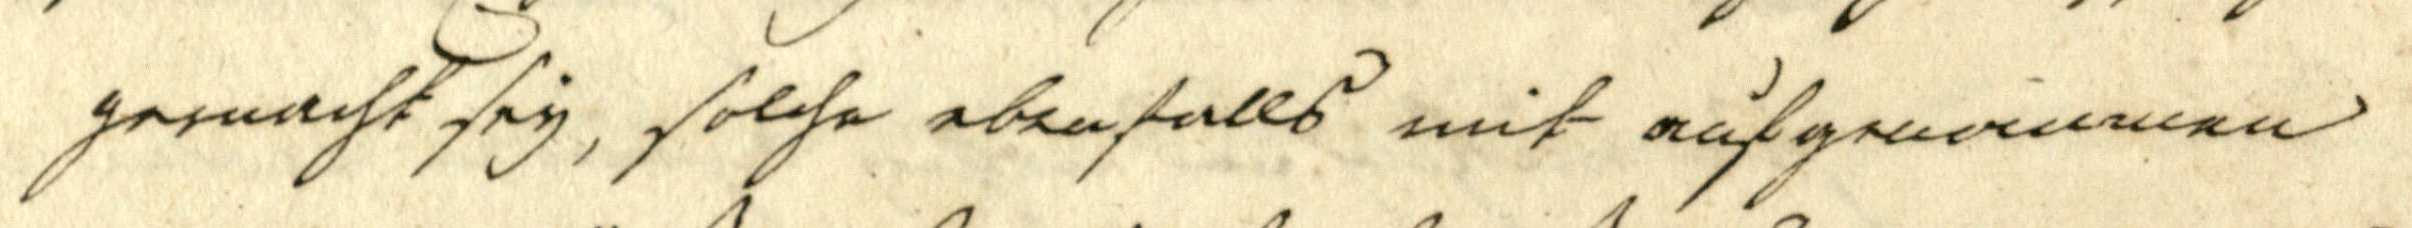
gemacht seÿ, solche ebenfalls mit aufgenommen
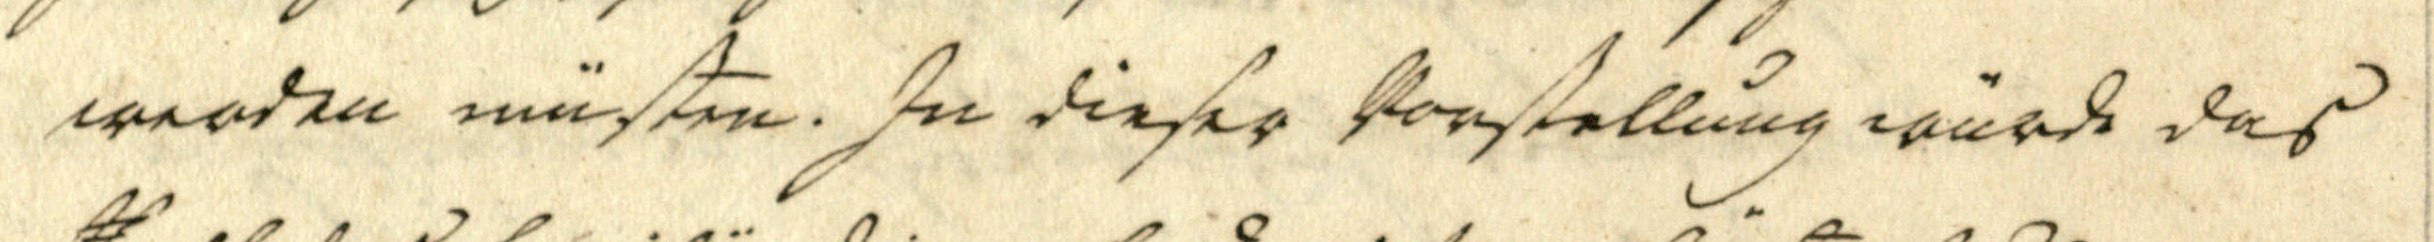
werden müßten. In dieser Vorstellung würde das
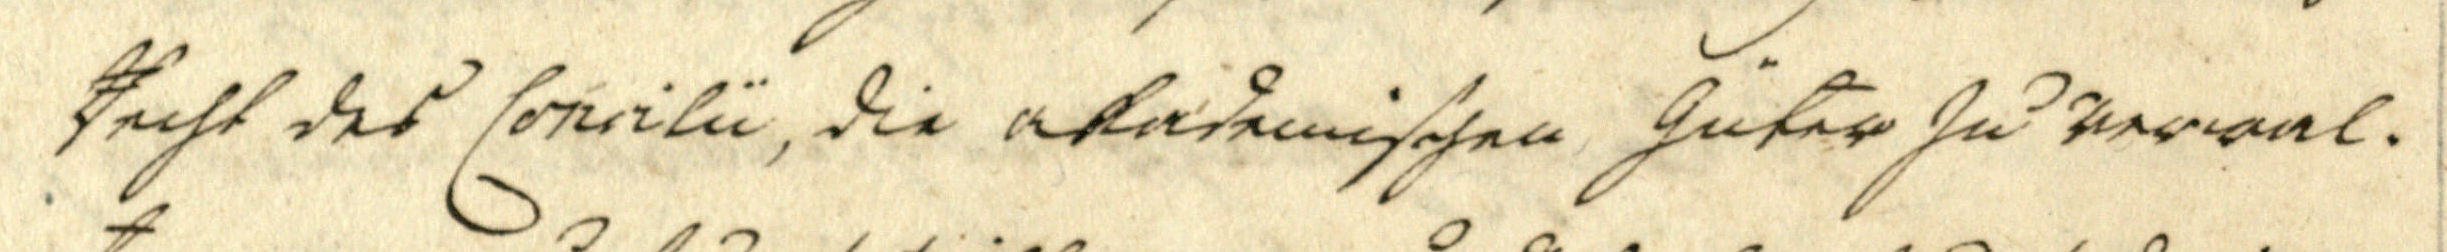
Recht des Concilii, die akademischen Güter zu verwal¬
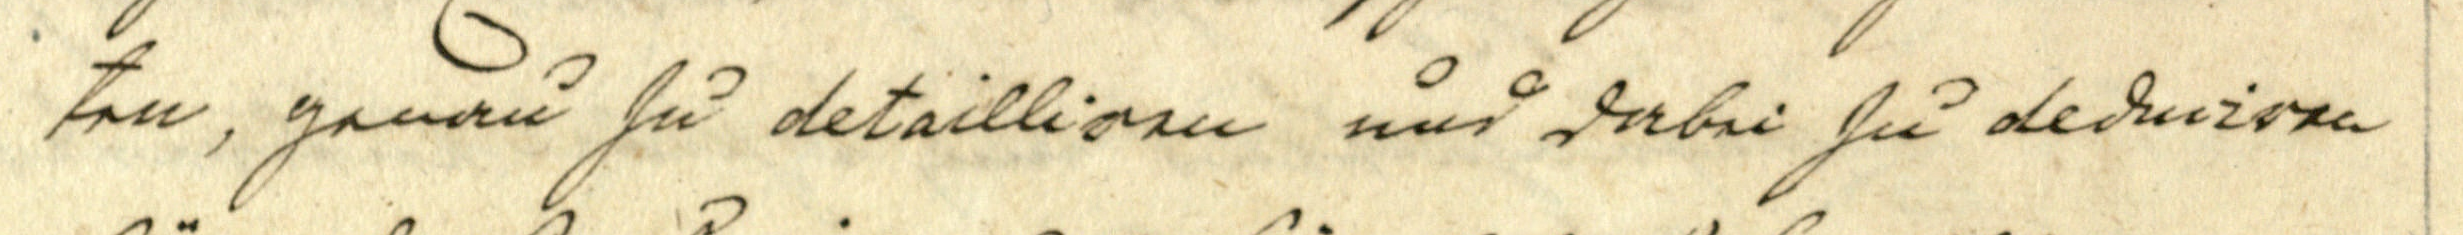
ten, genau zu datailliren und dabei zu deduciren
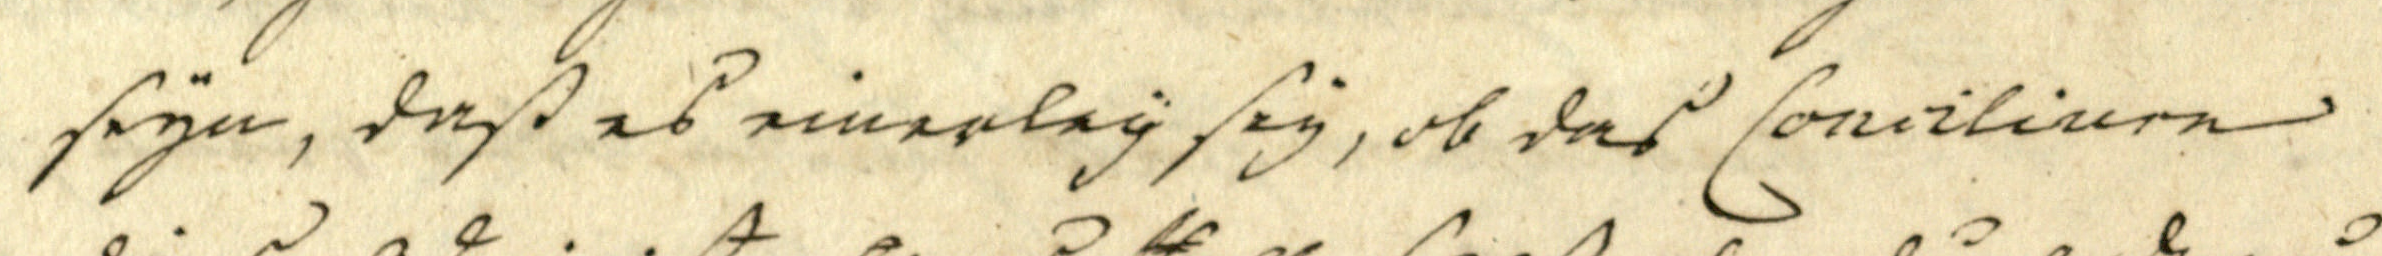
seÿn, daß es einerleÿ seÿ, ob das Concilium
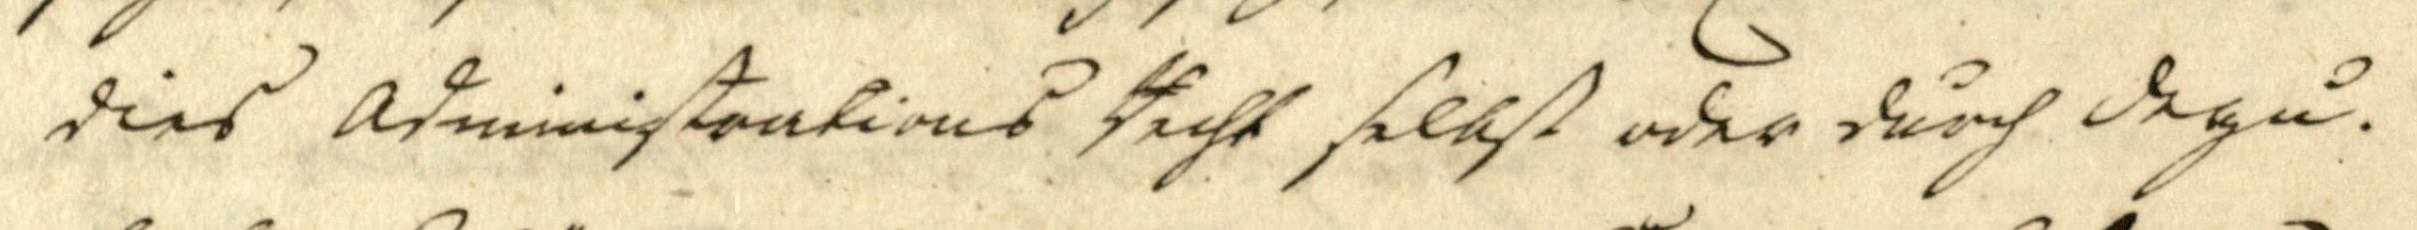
dies Administrations Recht selbst oder durch Depu¬
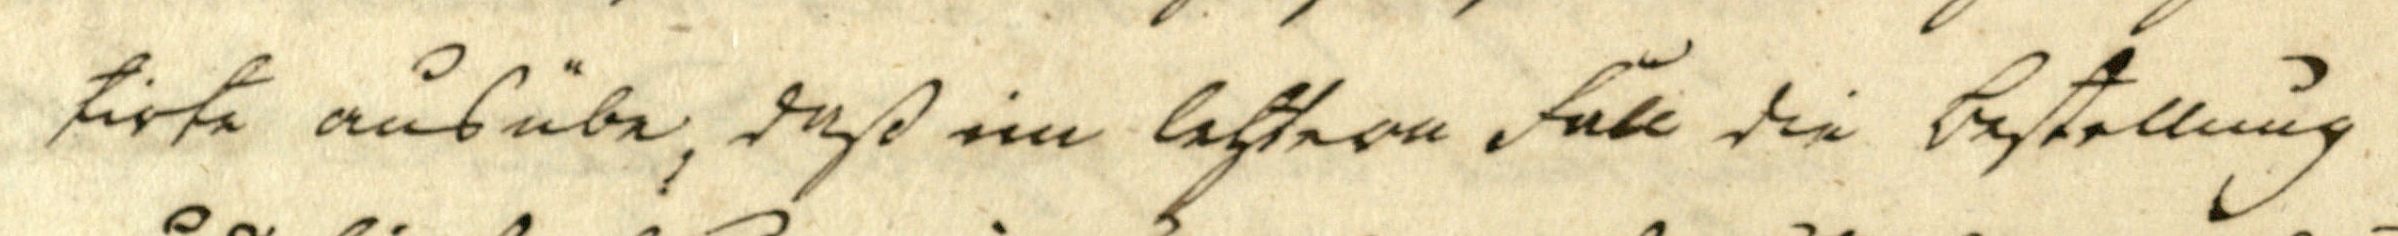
tirte ausübe, daß im letztern Fall die Bestellung
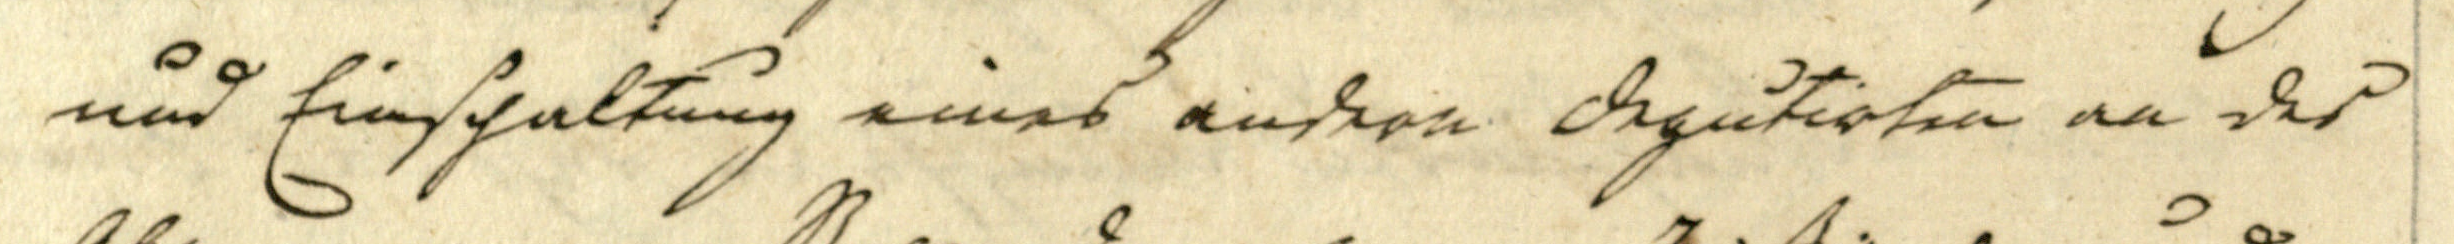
und Einschaltung eines andern Deputirten an der
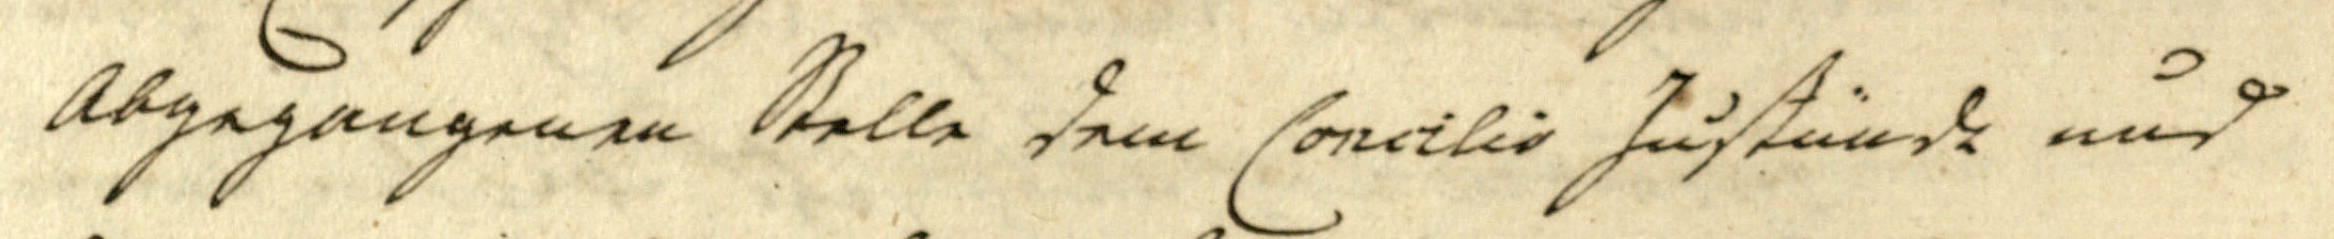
Abgegangenen Stelle dem Concilio zustünde und
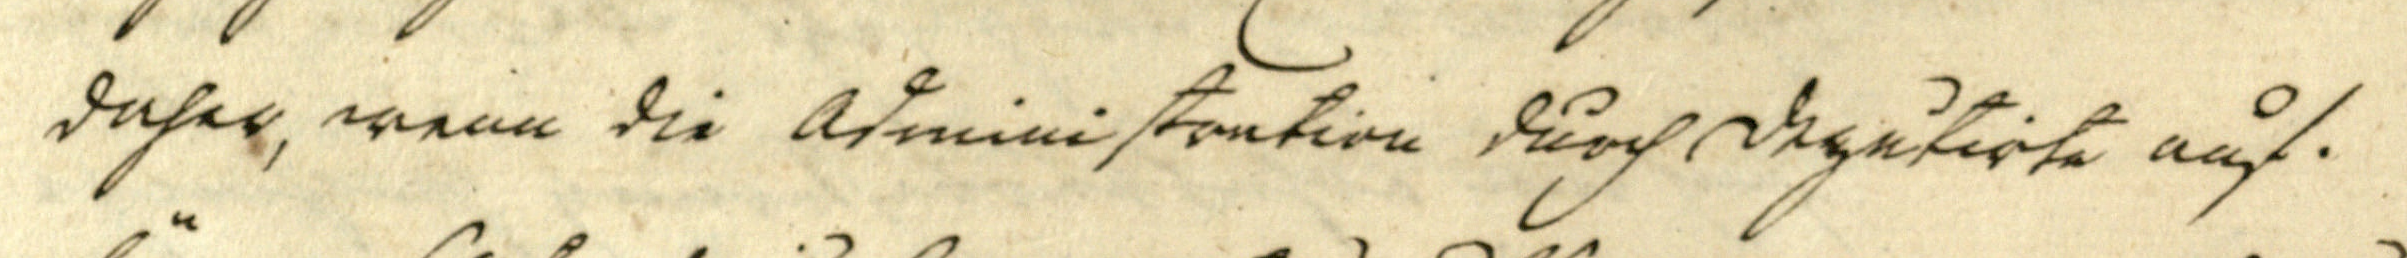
daher, wenn die Administration durch Deputirte auf¬
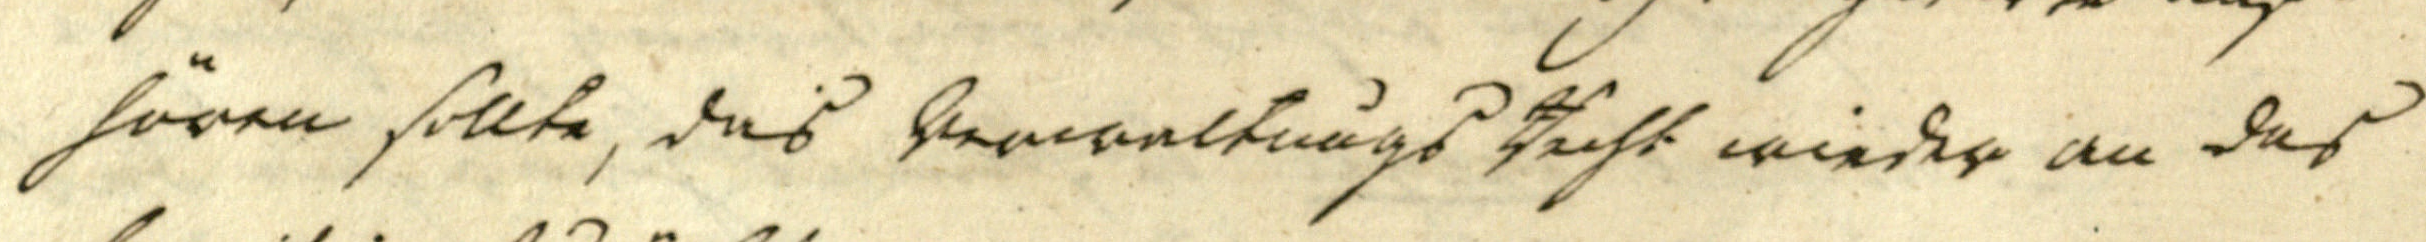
hören sollte, das Verwaltungs Recht wieder an das
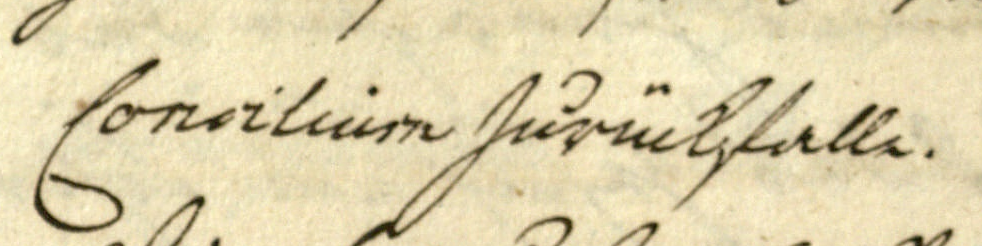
Concilium zurückfalle.
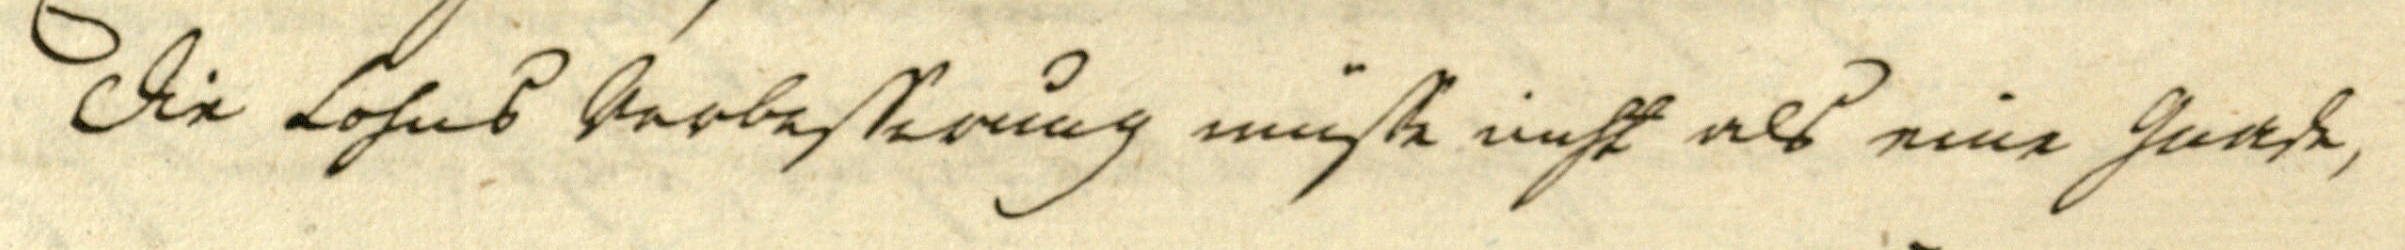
Die Lohns Verbesserung müsse nicht als eine Gnade,
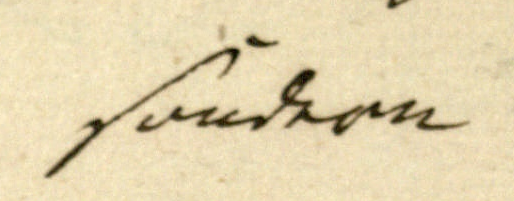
sondern
